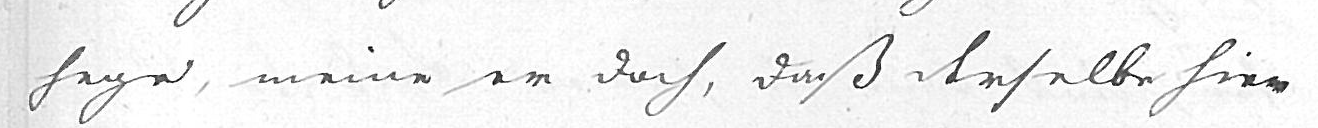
hege, meine er doch, daß derselbe hier
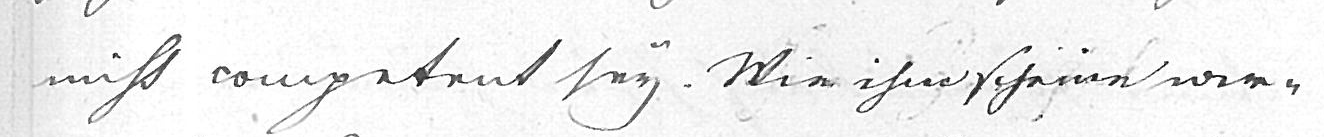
nicht competent sey. Wie ihm scheine wer-
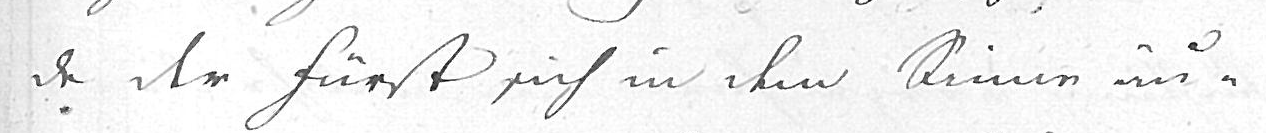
de der Fürst sich in dem Sinne äu-
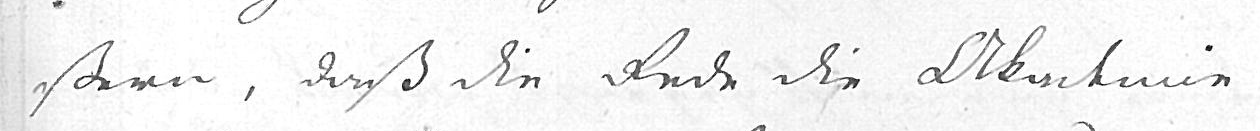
ßern, daß die Rede die Akademie
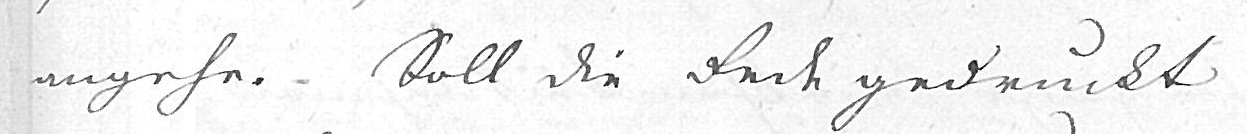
angehe. Soll die Rede gedruckt
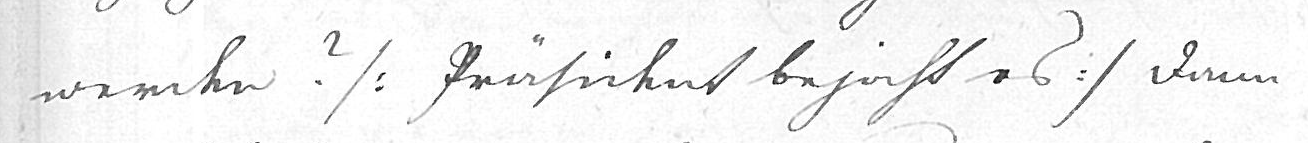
werden? (Präsident bejaht es) dann
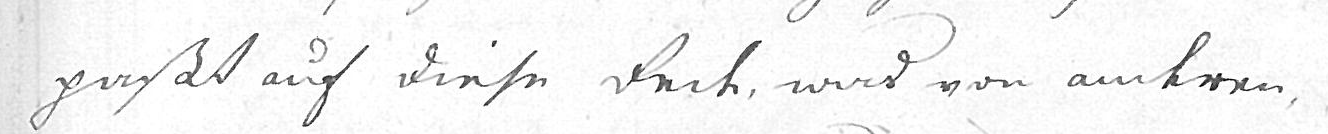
paßt auf diese Rede, was von anderen
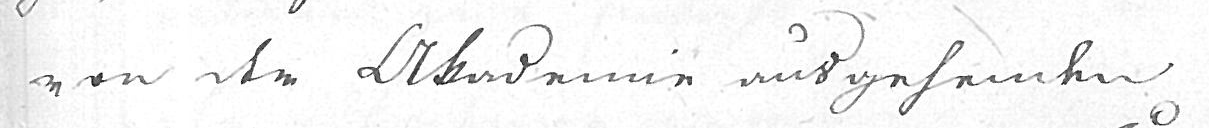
von der Akademie ausgehenden
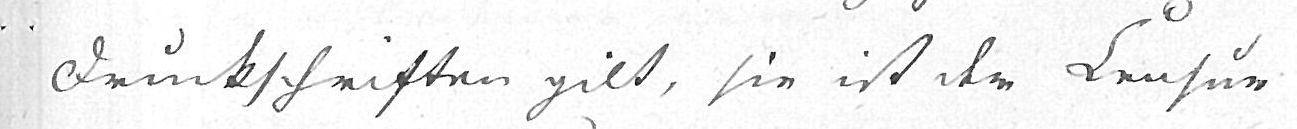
Druckschriften gilt, sie ist der Censur
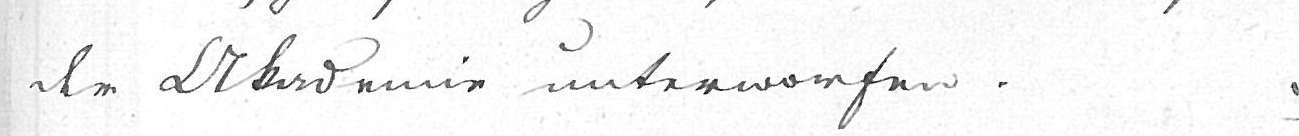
der Akademie unterworfen.
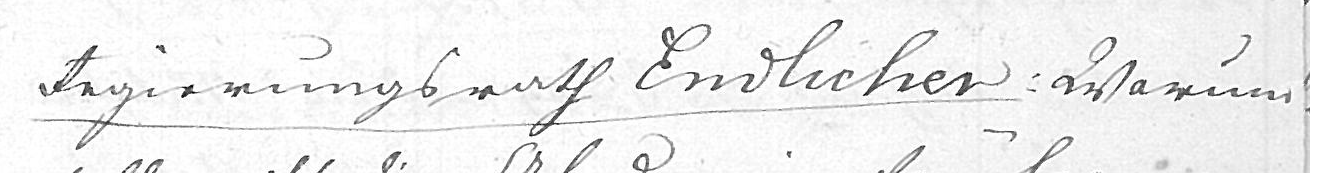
Regierungsrath Endlicher: Warum
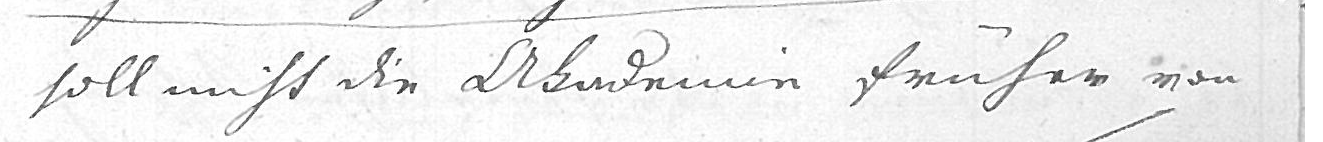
soll nicht die Akademie früher von
